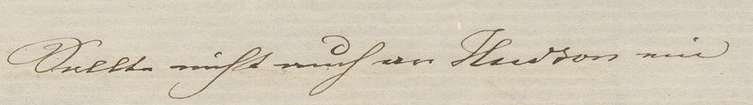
Sollte nicht auch an Hudson ein
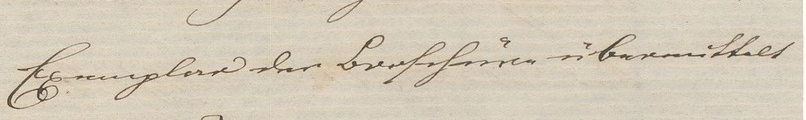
Exemplar der Broschüre übermittelt
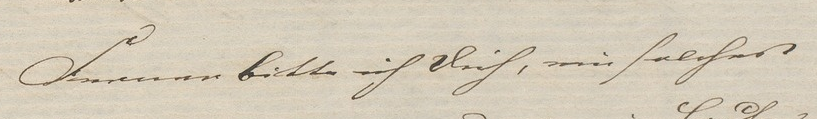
Ferner bitte ich Dich, ein solches
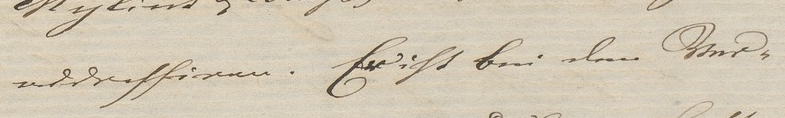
addressiren. Er ist bei den Ver-
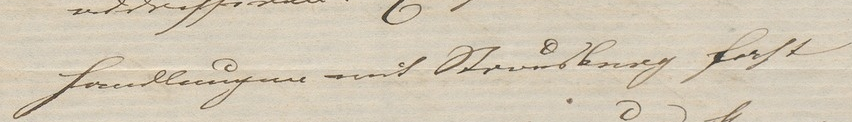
handlungen mit Strousberg fast
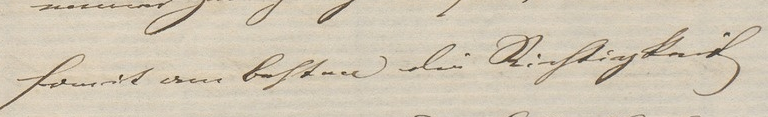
somit am besten die Richtigkeit
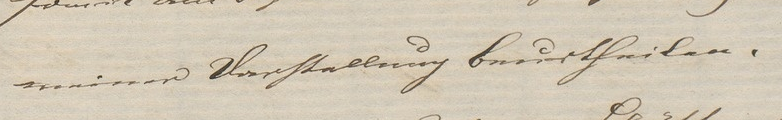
meiner Darstellung beurtheilen.
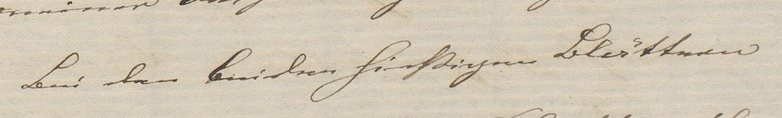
Bei den beiden hießigen Blättern
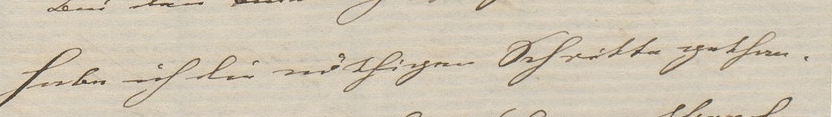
habe ich die nöthigen Schritte gethan.
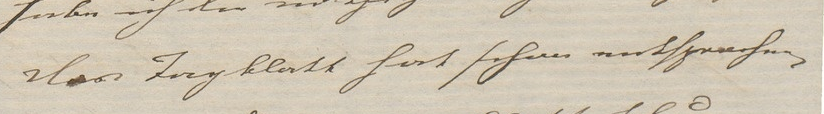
Das Tagblatt hat schon entsprochen,
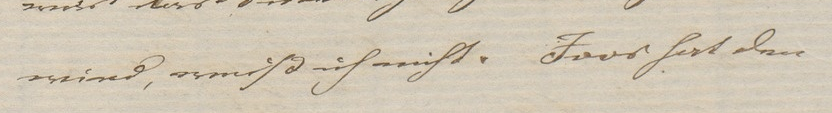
wird, weiß ich nicht. Joos hat den
